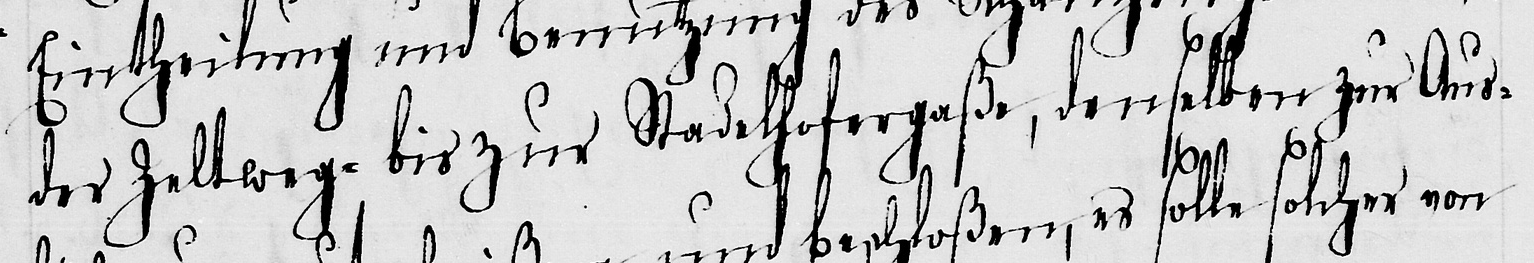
der Zeltweg- bis zur Stadelhofergaße, denselben zur Aus¬
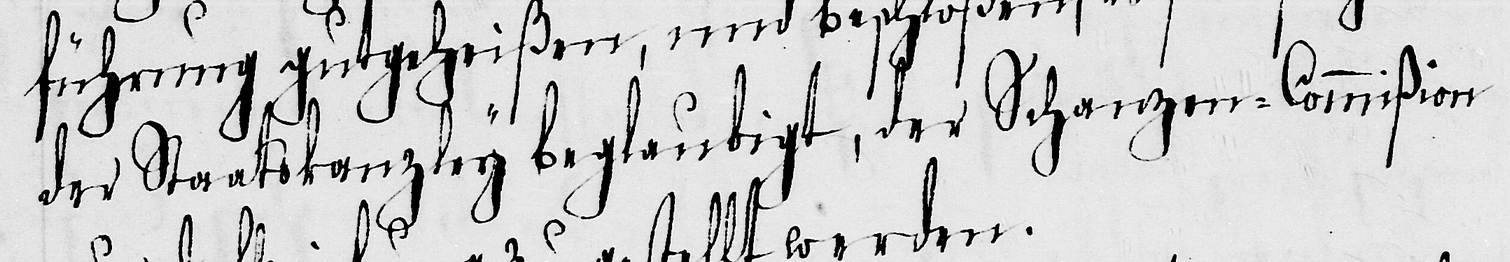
der Staatskanzley beglaubigt, der Schanzen-Commißion
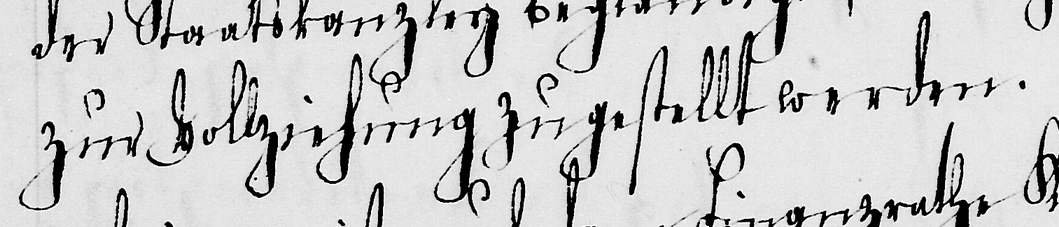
zur Vollziehung zugestellt werden.
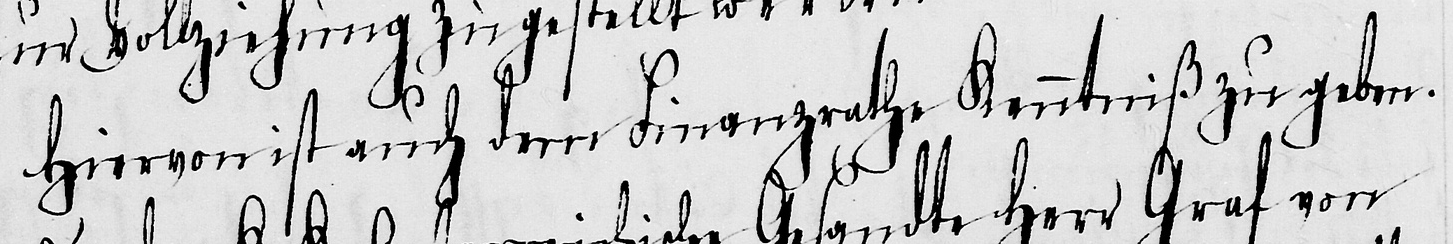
Hiervon ist auch dem Finanzrathe Kenntniß zu geben.
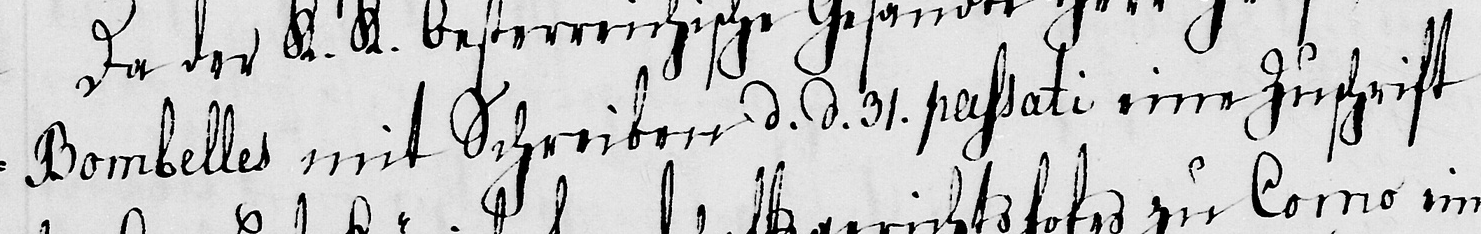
Bombelles mit Schreiben d. d. 31. passati eine Zuschrift
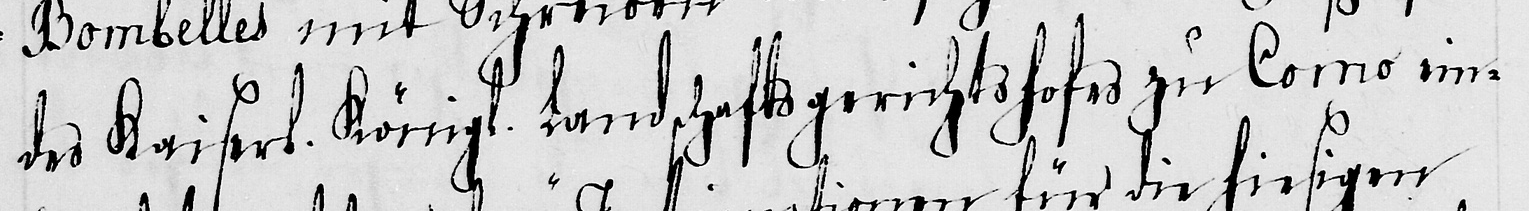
des Kaiserl. Königl. Landschaftsgerichtshofes zu Como ein¬
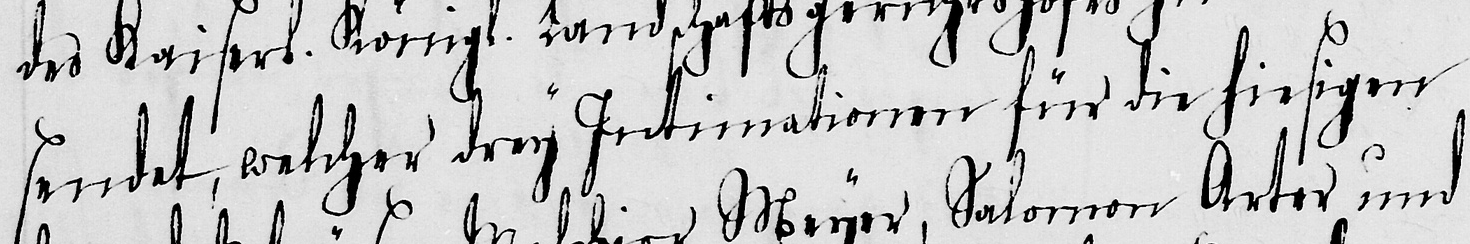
sendet, welcher drey Intimationen für die hiesigen
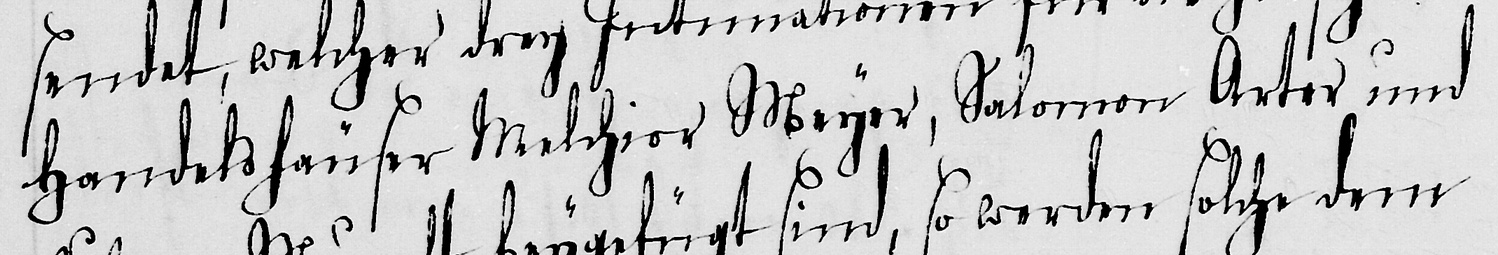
Handelshäuser Melchior Meyer, Salomon Arter und
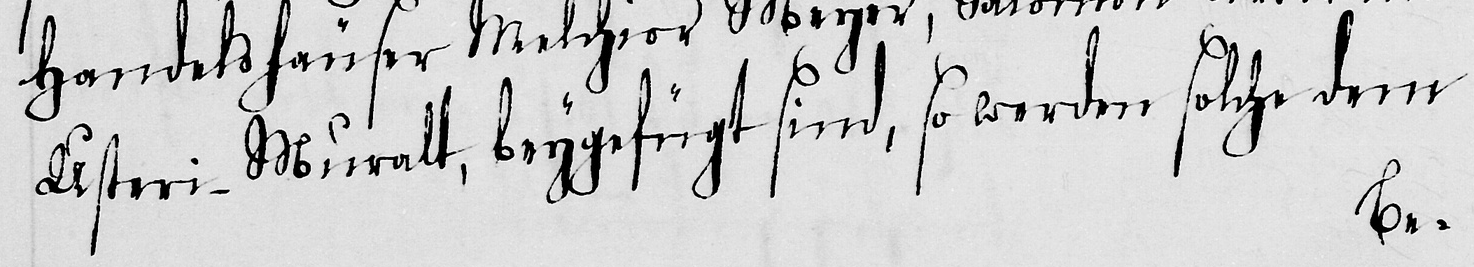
Usteri-Muralt, beygefügt sind, so werden solche dem
